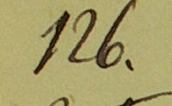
126
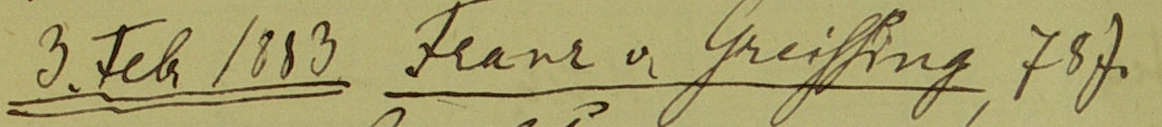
3.Febr /883. Franz von Greissing 78 J.
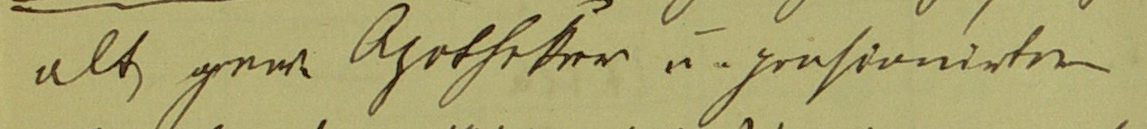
alt, gewesener Apotheker u. pensionierter
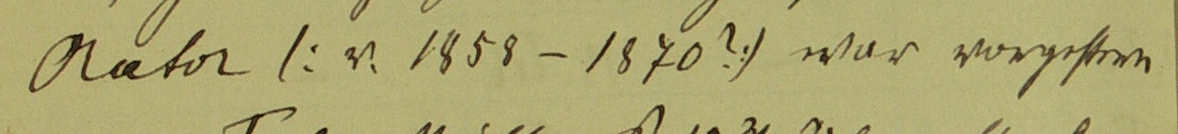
Notar ( : v. 1858-1870 ?:) war vorgestern
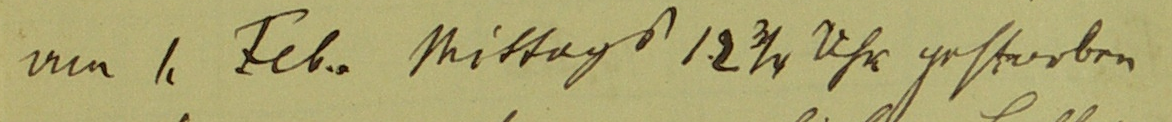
am 1. Febr. Mittags 12 ¾ gestorben
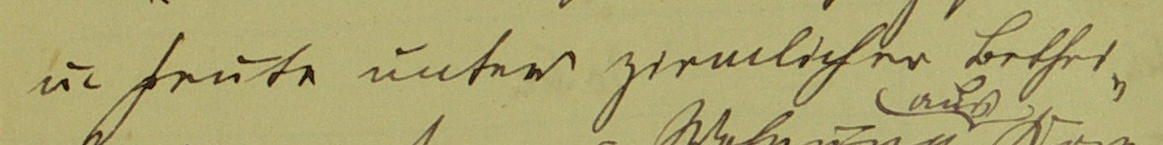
und heute unter ziemlicher Bethei¬
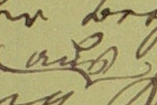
aus
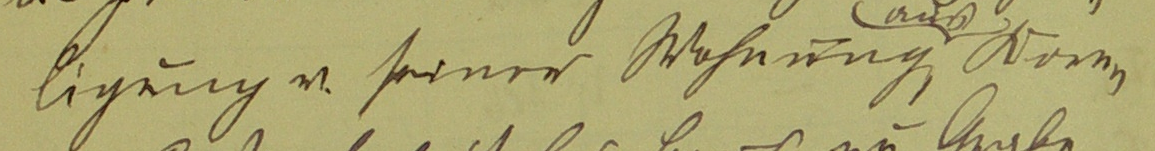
ligung v. seiner Wohnung, Korn¬
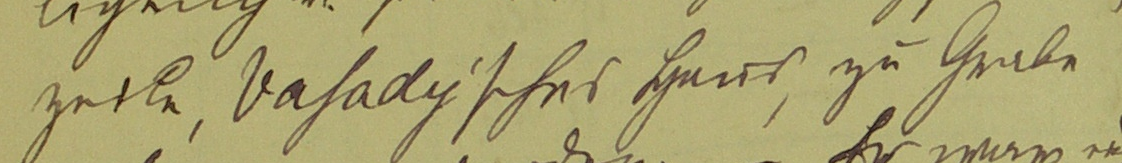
zeile Vasady‘sches Haus, zu Grabe
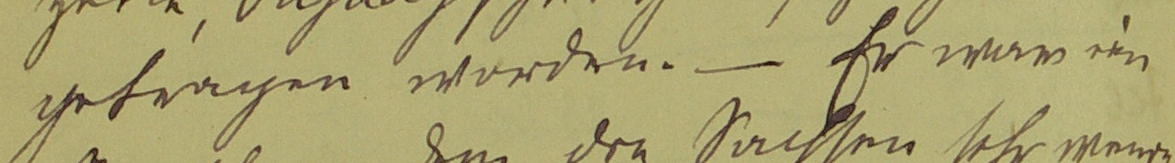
getragen worden. - Er war ein
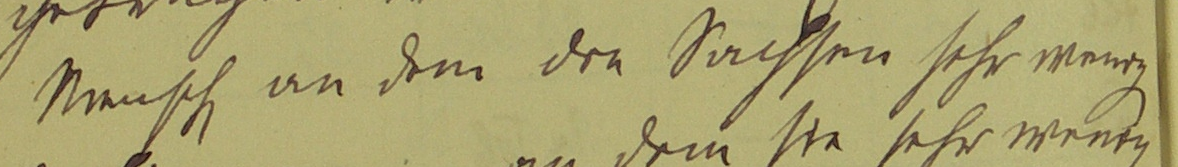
Mensch an dem die Sachsen sehr
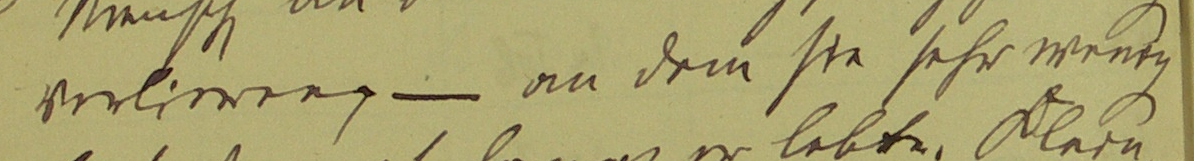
wenig verlieren, - an dem sie sehr wenig
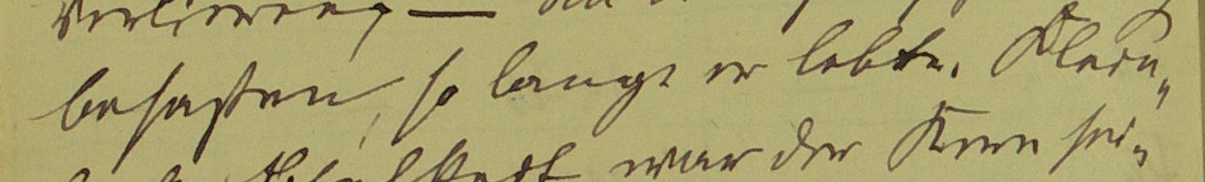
besaßen so lange er lebte. Klein¬
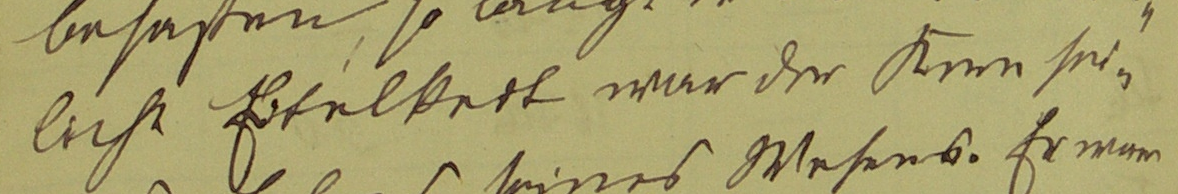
liche Eitelkeit war der Kern sei¬
